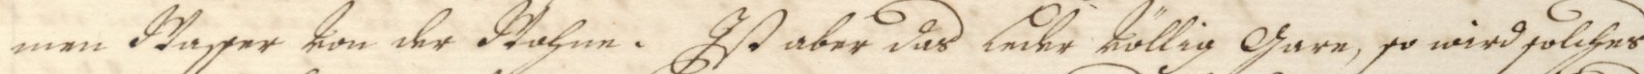men Wasser von der Wohne. Ist aber das Leder völlig Gare, so wird solches
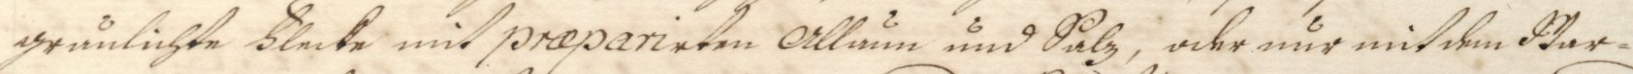graulichte Flecke mit præparirten Allaun und Salz, oder nur mit dem War-
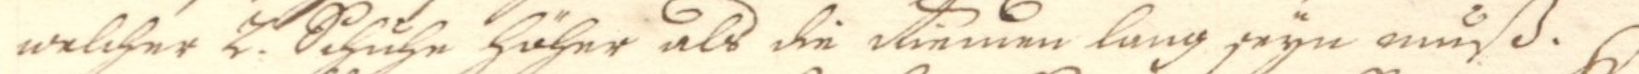welcher 2. Schuhe höher als die Riemen lang seyn muß.
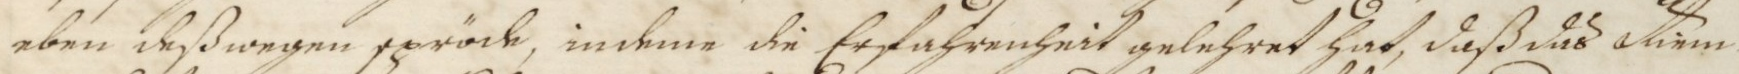eben deßwegen spröde, indeme die Erfahrenheit gelehret hat, daß das Riem-
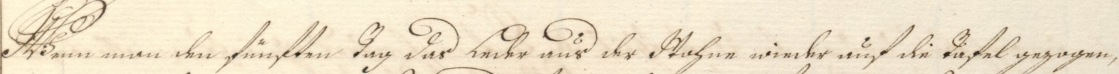Wenn man den fünften Tag das Leder aus der Wohne wieder auf die Tafel gezogen,
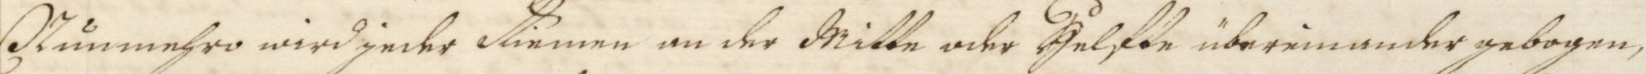Nunmehro wird jeder Riemen an der Mitte oder Helfte übereinander gebogen,
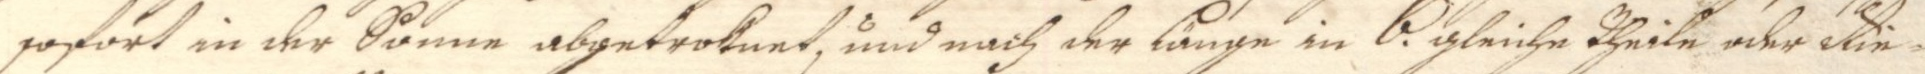sofort in der Sonne abgetroknet, und nach der Länge in 6. gleiche Theile oder Rie-
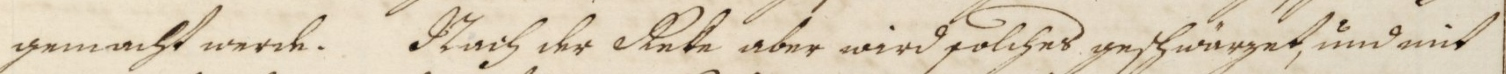gemacht werde. Nach der Reke aber wird solches geschwärzet, und mit
